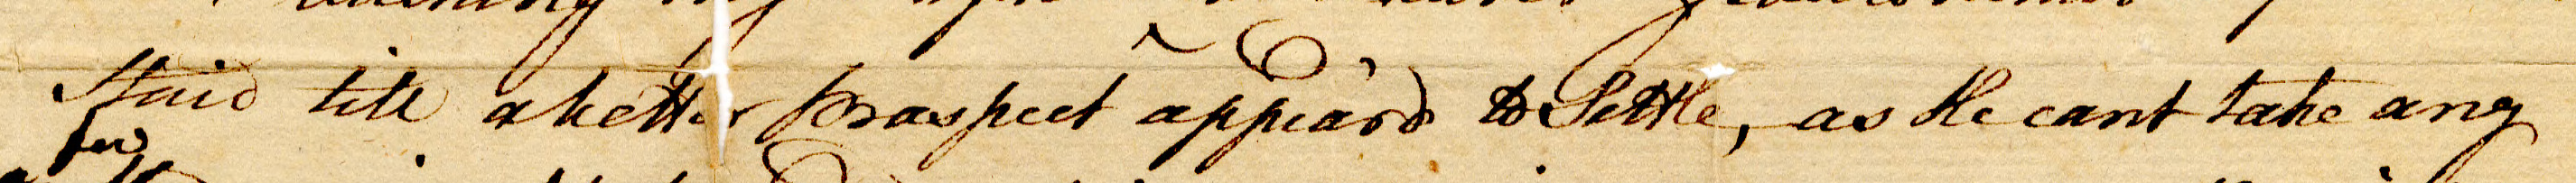staid till a better Prospect appeared to Settle, as He cant take any
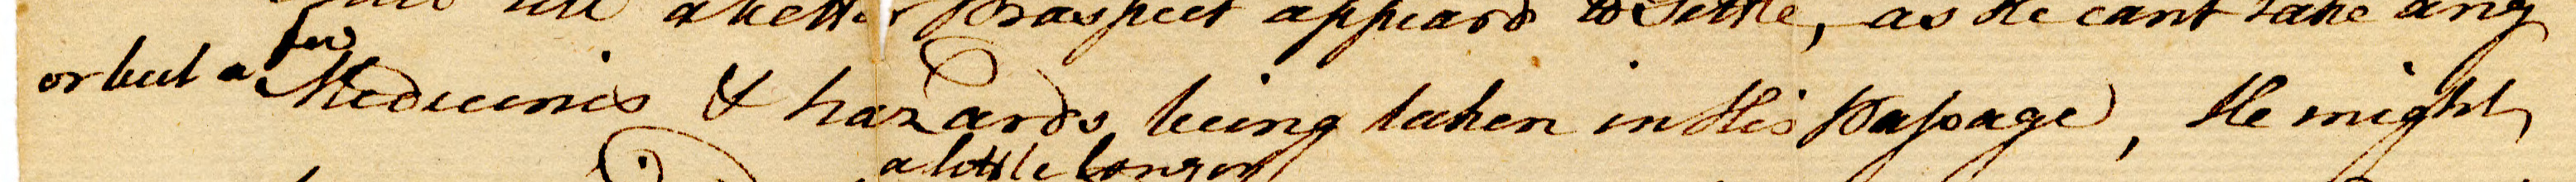or but a few Medicines & hazards being taken in His passage, He might
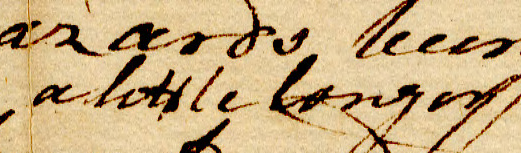a little longer
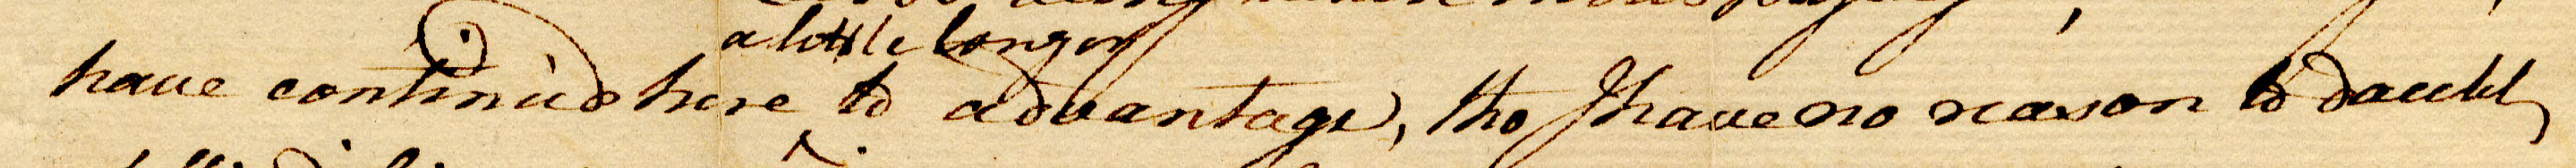have continu'd here ^ to advantage, tho I have no reason to doubt
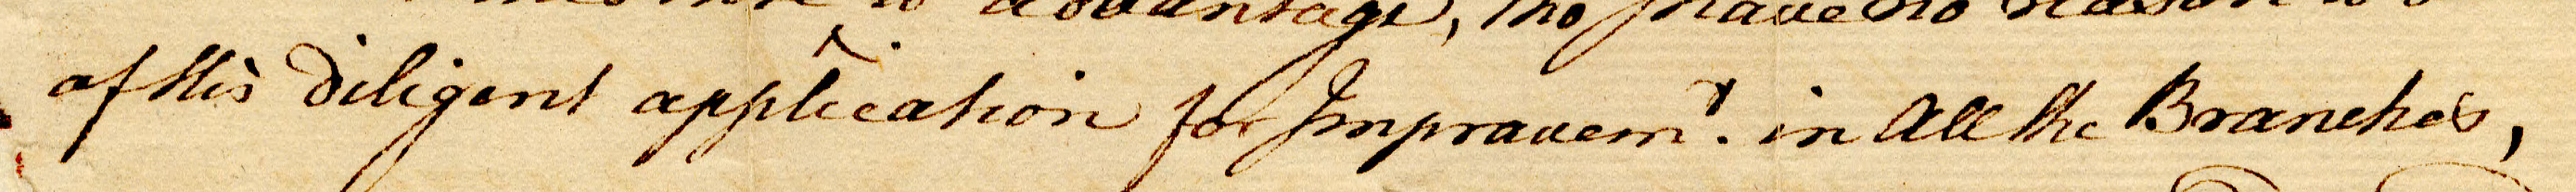of His diligent application for Impravem^t. in All the Branches,
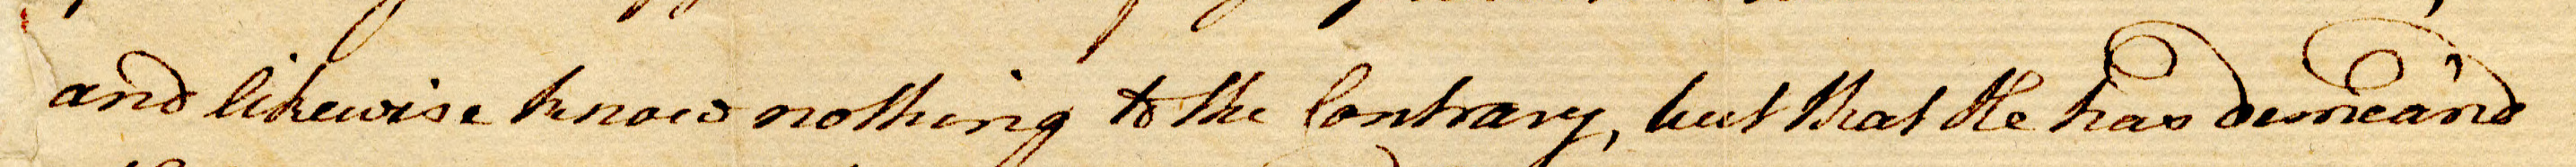and likewise know nothing to the Contrary, but that He has demean'd
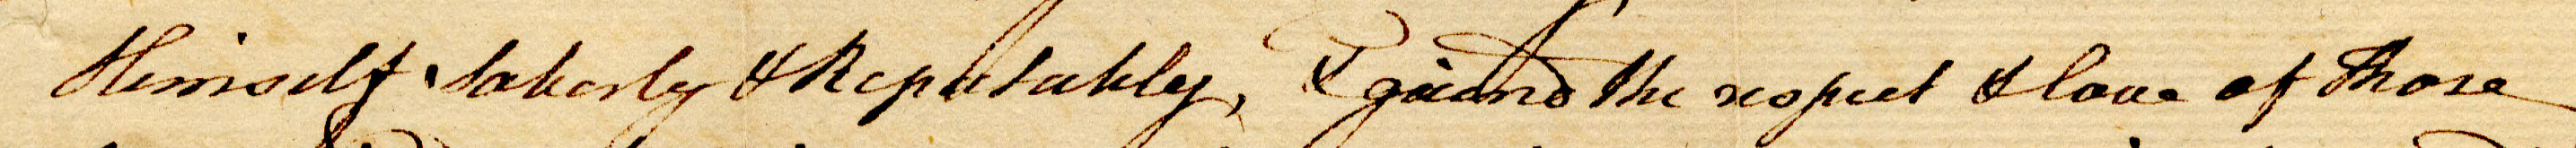Himself Soberly & Respectably, I guard the respect & love of Those
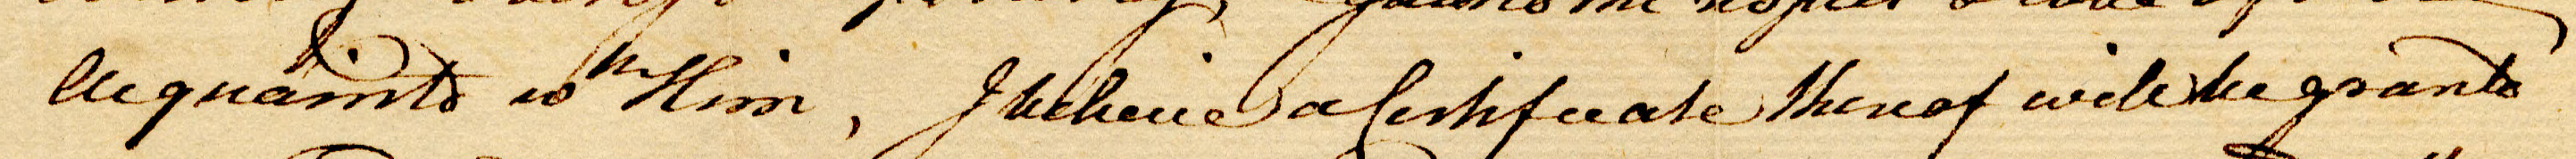acquaintd w^th Him, I believe a Certificate Thereof will be grantd
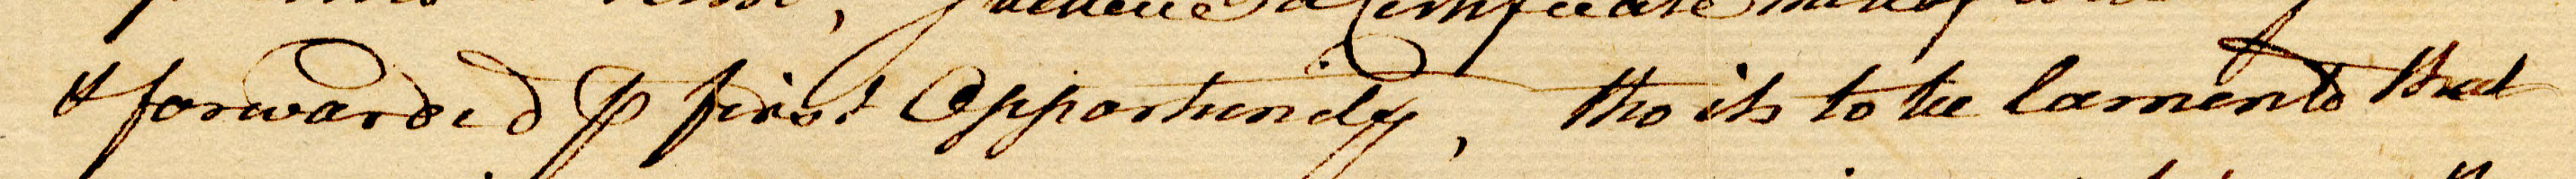& forwarded per first Opportunity, tho its to be lamentd that
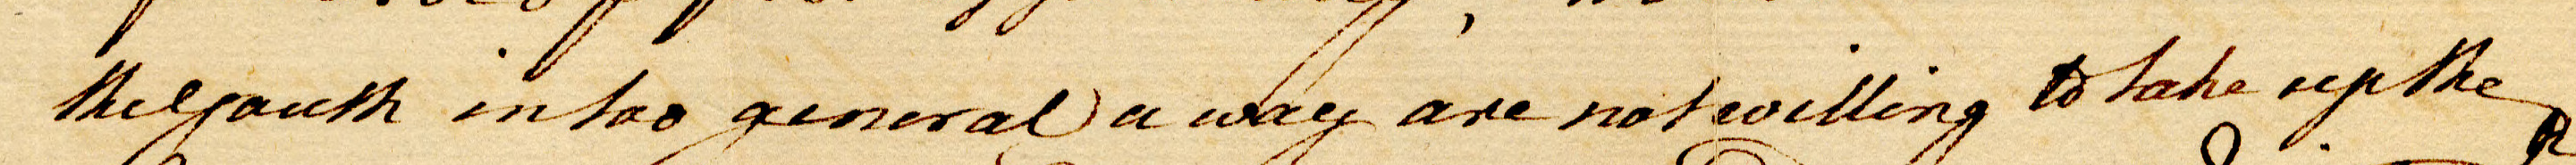the youth in too general a way are not willing to take up the
